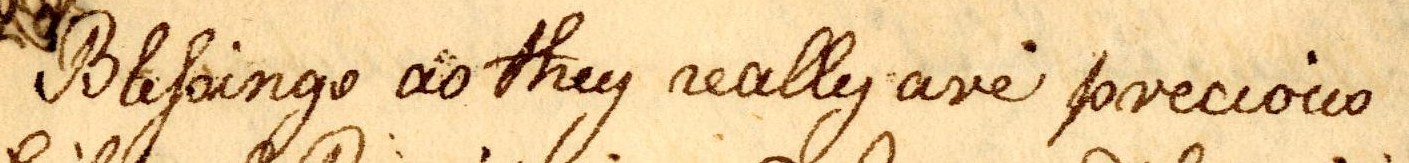Blessings as they really are precious
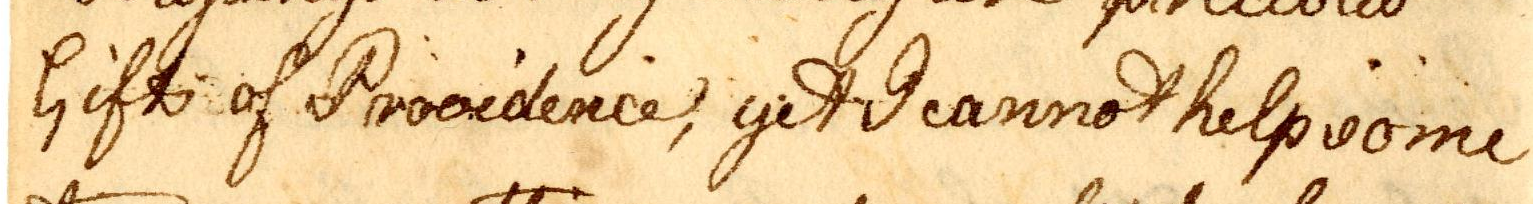Gifts of Providence, yet I cannot help some
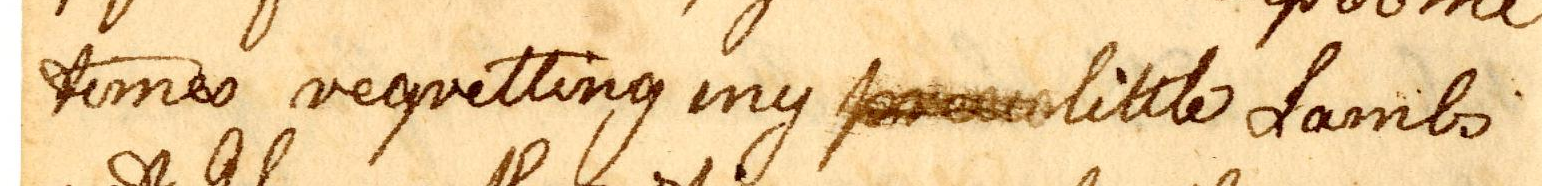times regretting my [_____] little Lamb
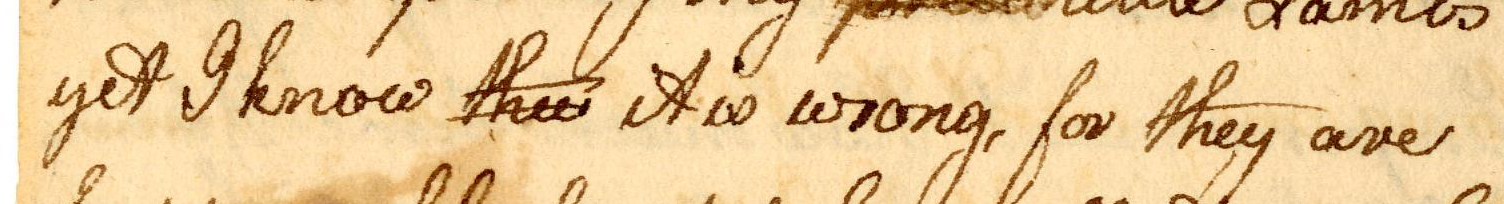yet I know [thee] it is wrong, for they are
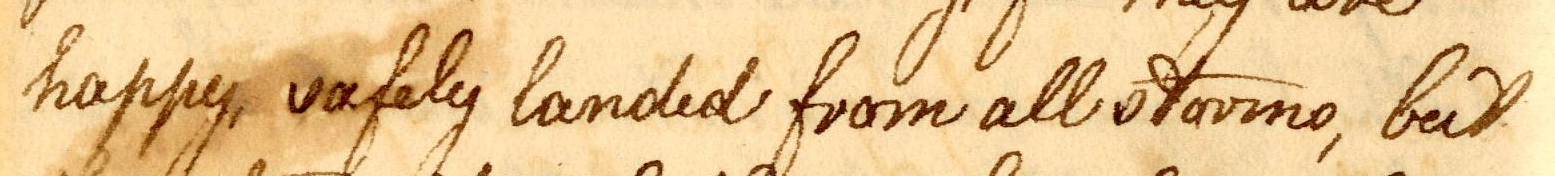happy, safely landed from all storms, but
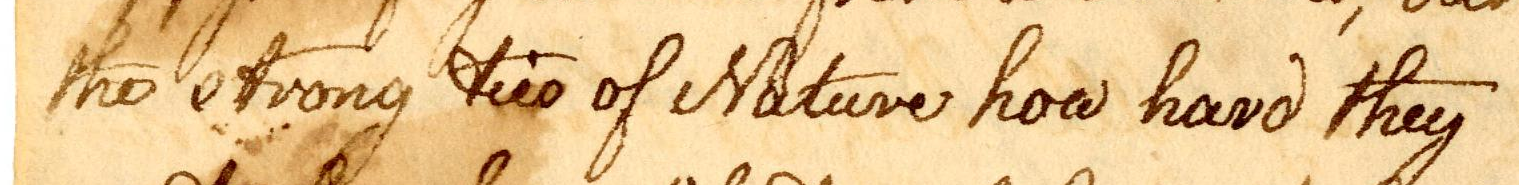the strong ties of Nature how hard they
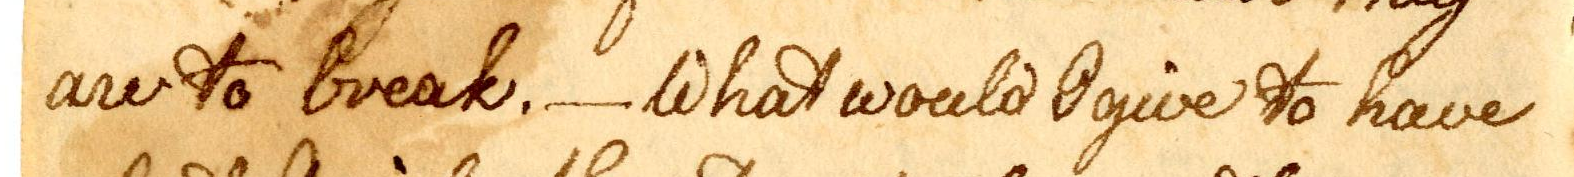are to break,- What would I give to have
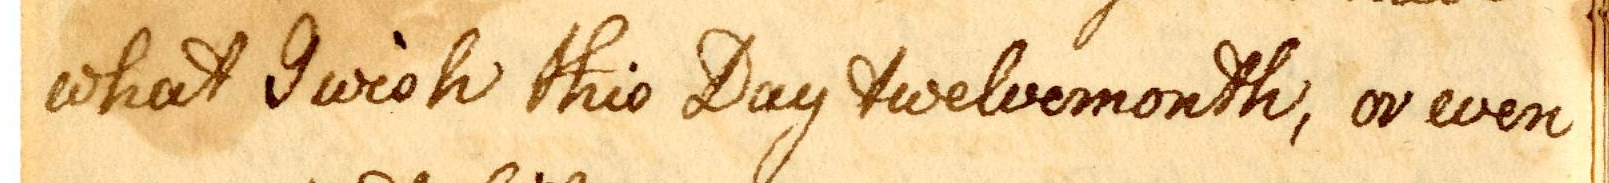what I wish this Day twelvemonth, or even
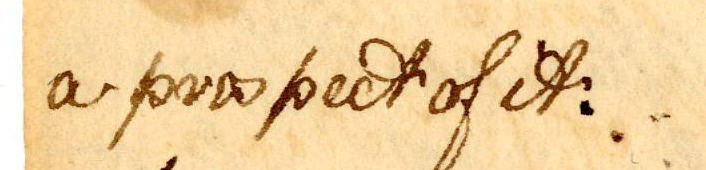a prospect of it.
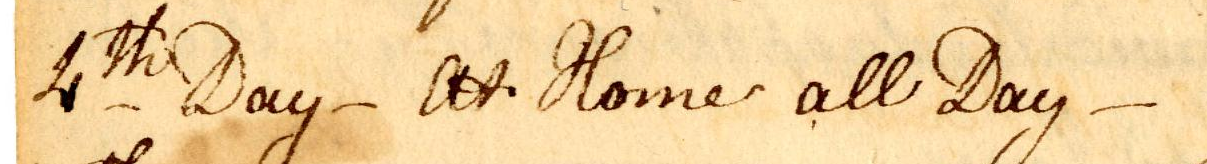4^th Day- At Home all Day-
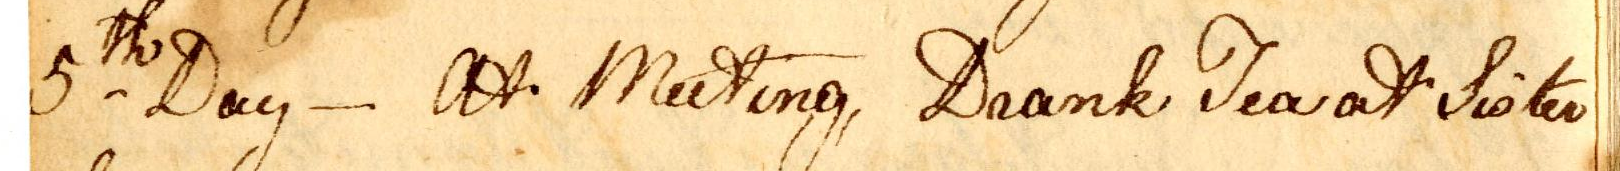5^th Day- At Meeting, Drank Tea at Sister
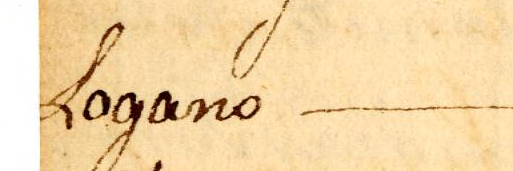Logans-
